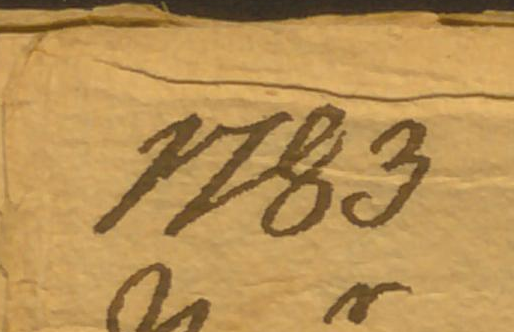1783
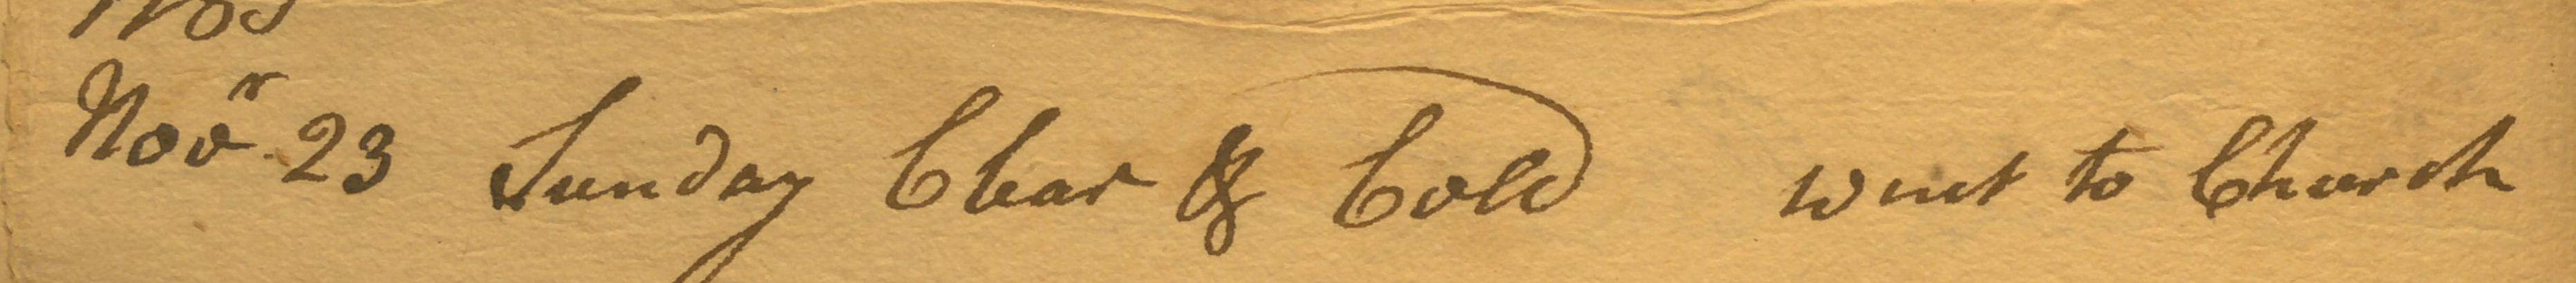Nov^r 23 Sunday Clear & Cold, went to Church
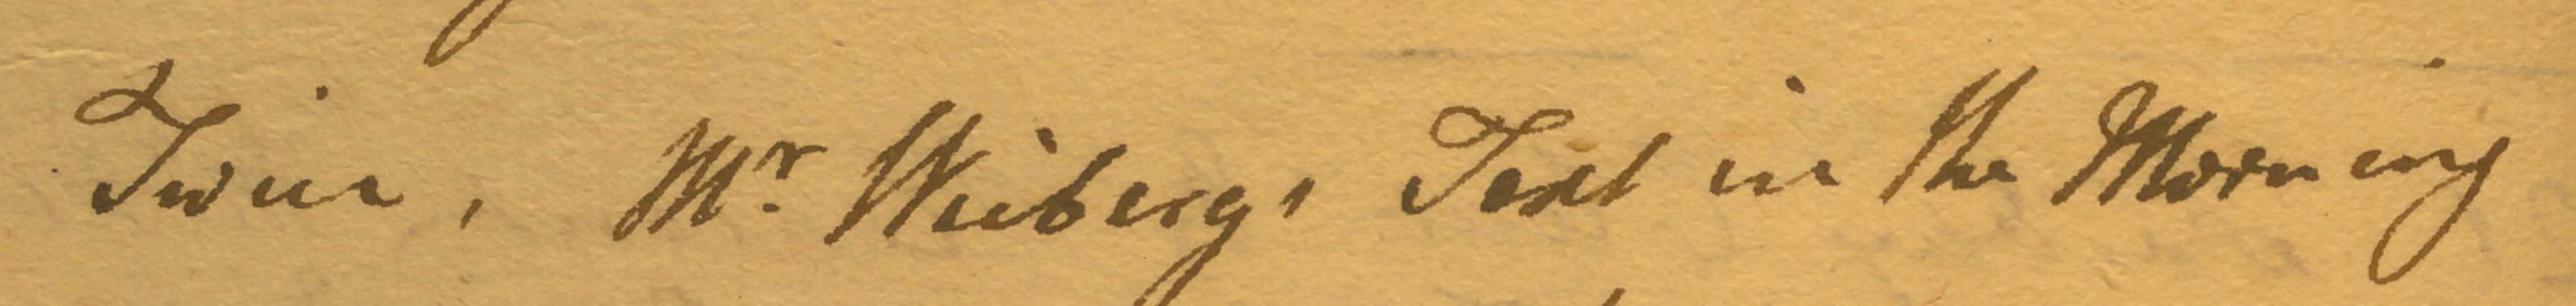Twice, M^r. Weibergs Text in the Morning
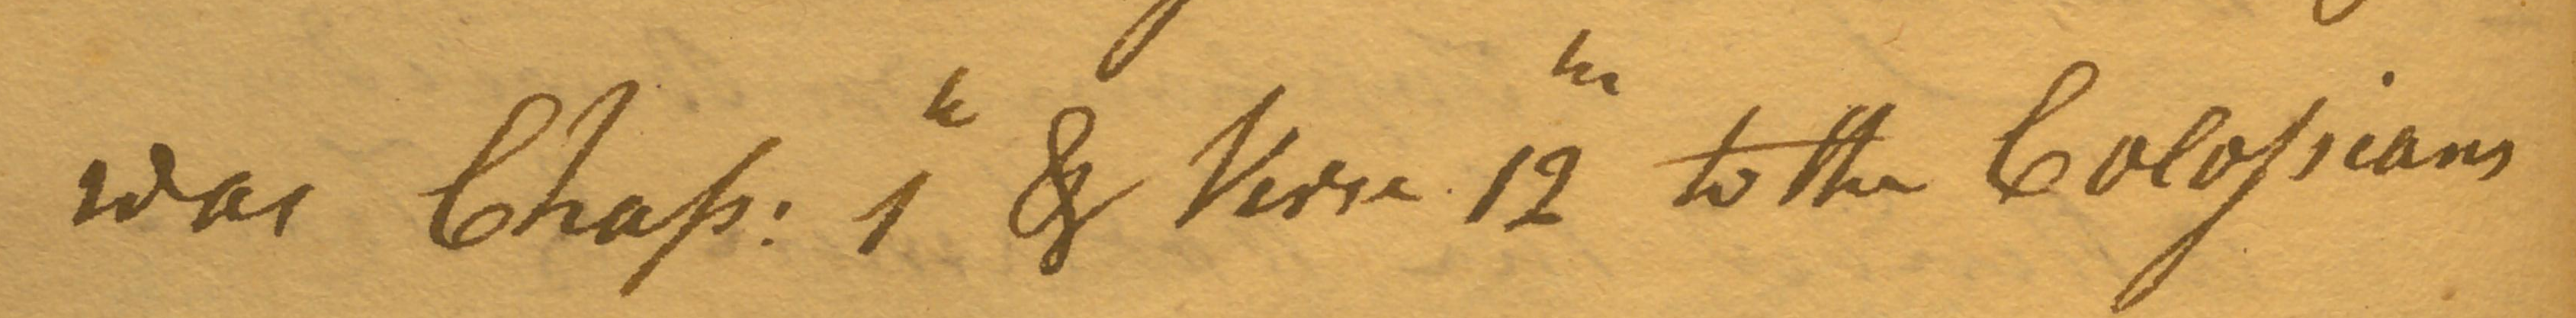was Chap: 1^th & Verse 12^th to the Colossians
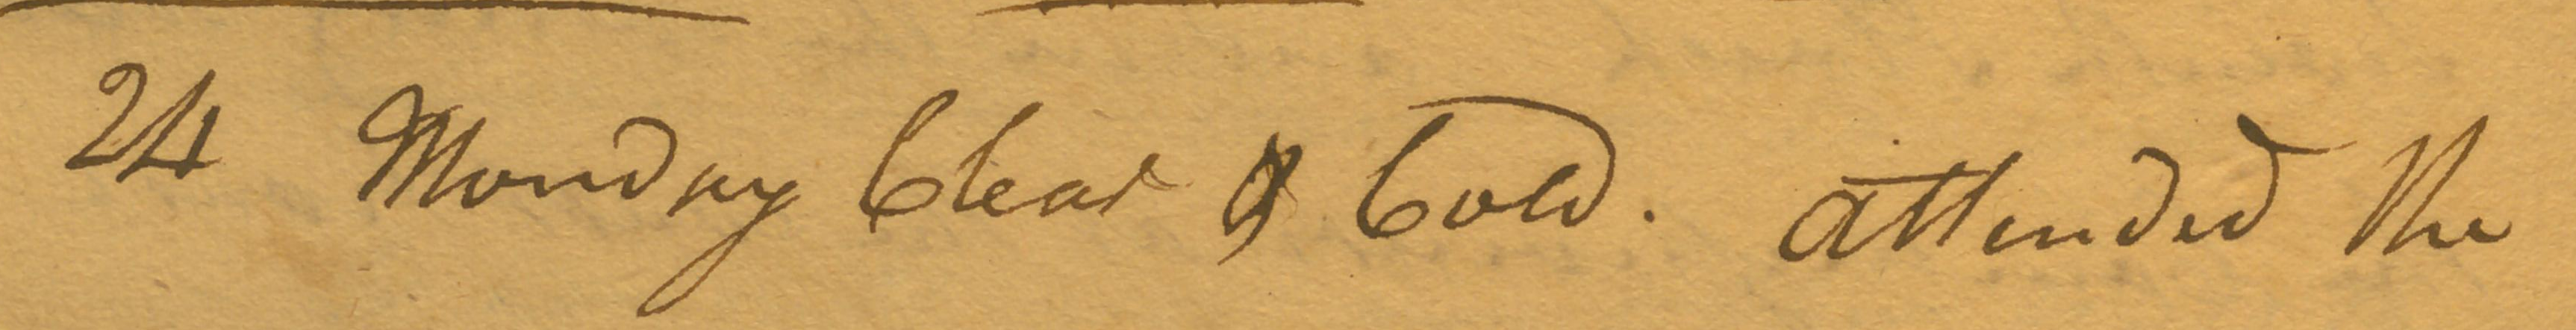24 Monday Clear & Cold. attended the
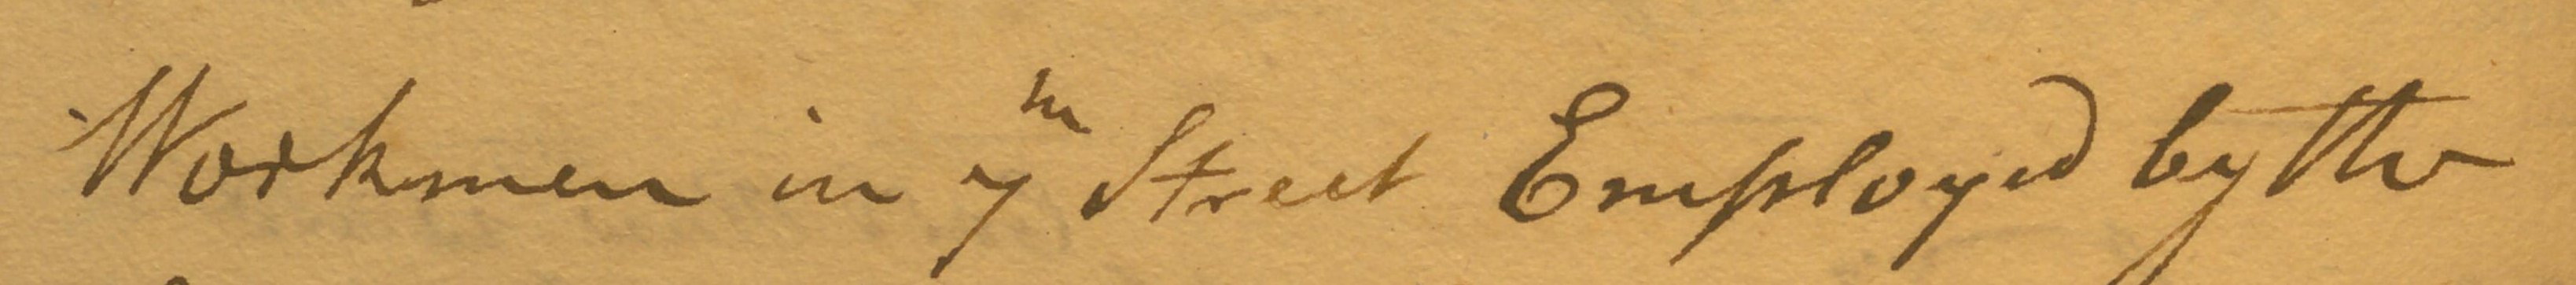Workmen in 7^th Street Employed by the
